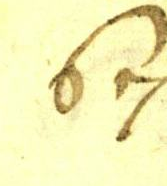67
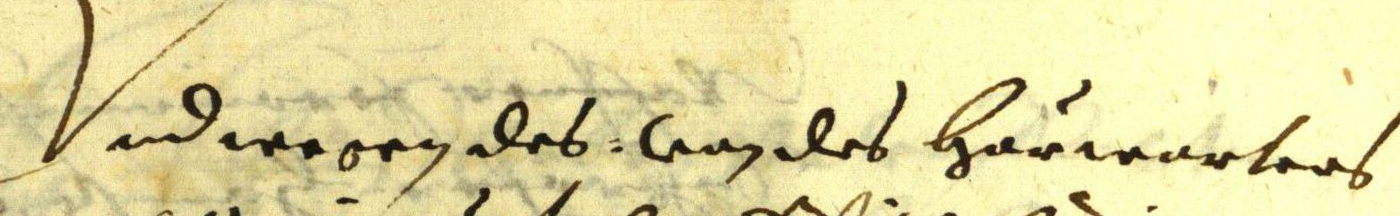Vnd wegen des: von des Hōrwarters
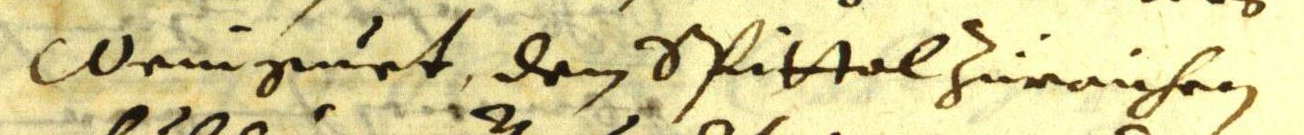Weingūet dem Spittal Zūraichen
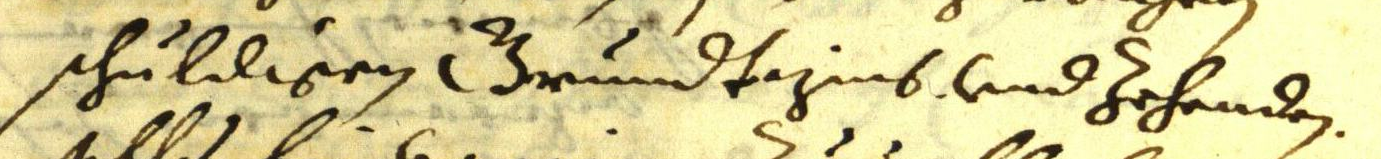schūldigen Grūndtzins. vnd Zehnden
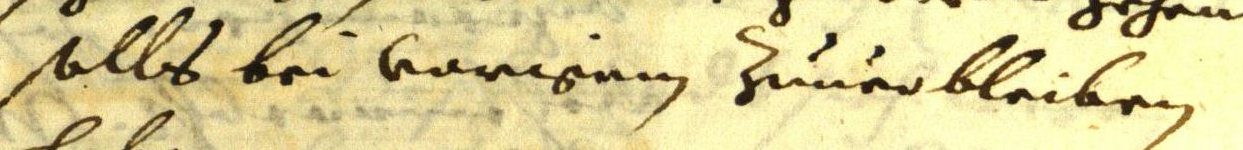solls bei vorigem Zūūerbleiben
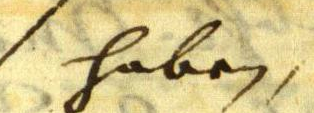haben,
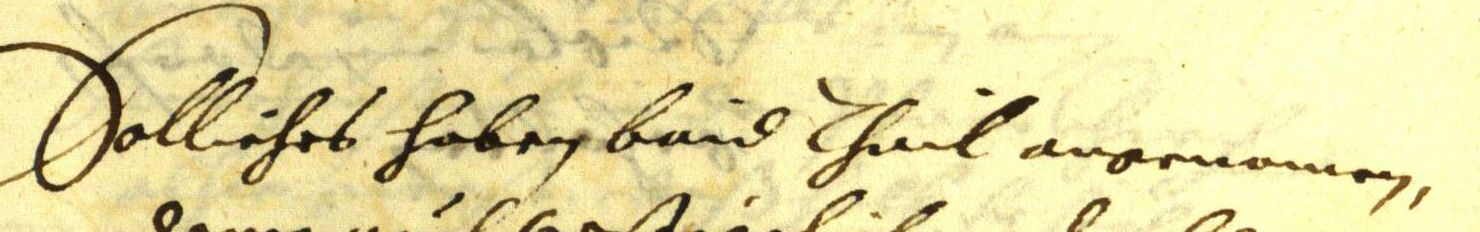Solliches haben baid Thail angenomen,
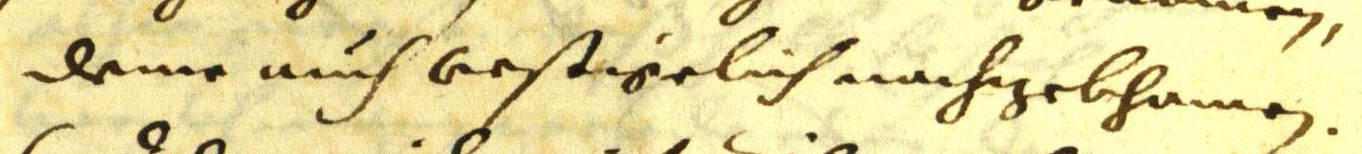deme aūch vestigelich nachzekhomen.
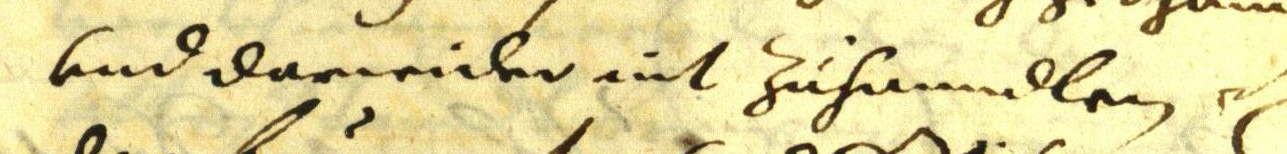vnd darwider nit Zūhanndlen
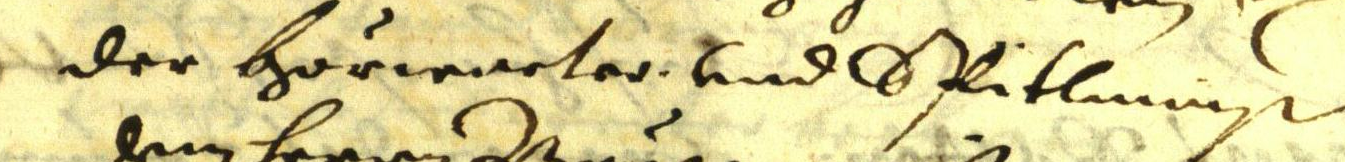der Hōrwarter. vnd SPitlmaist
